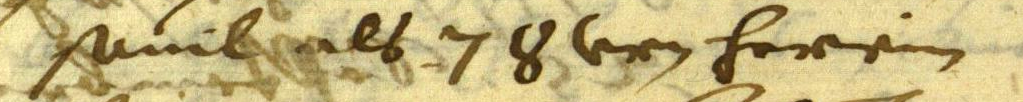soūil als 78 v̈rn herein
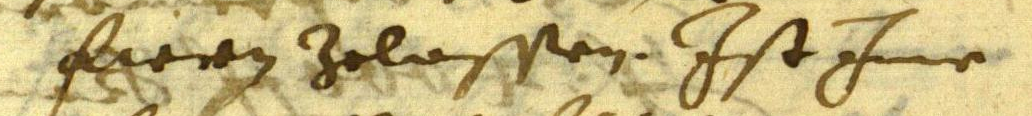fiern Zelassen. Ist Ime
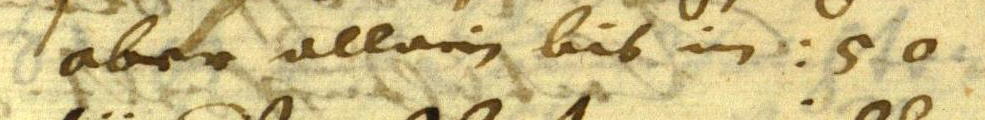aber allain bis in: 50
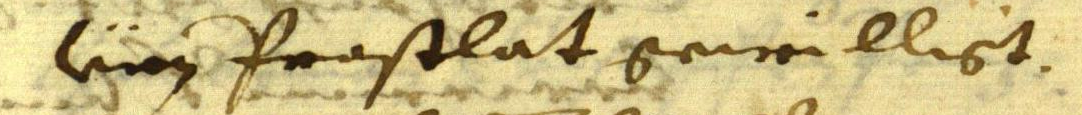v̈rn Prostlat gewilligt.
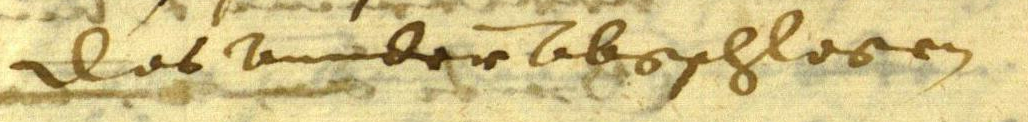das Annder Abgschlagen
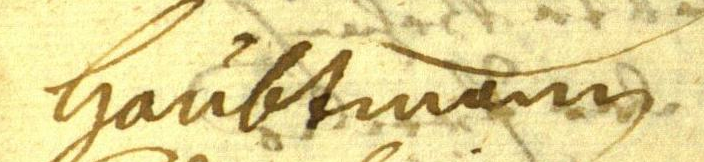Haūbtmann
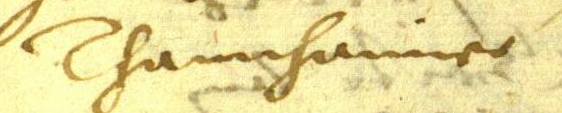Thannhaimer
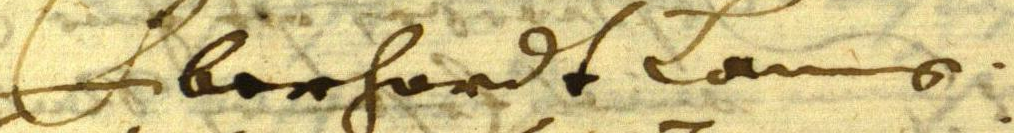Eberhardt Lanng.
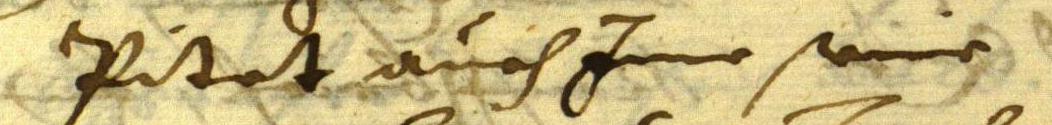Pitet aūch Ime seine
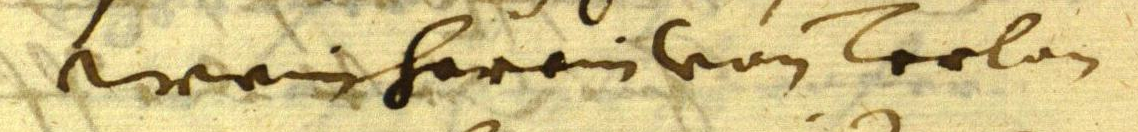wein herein von Terlan
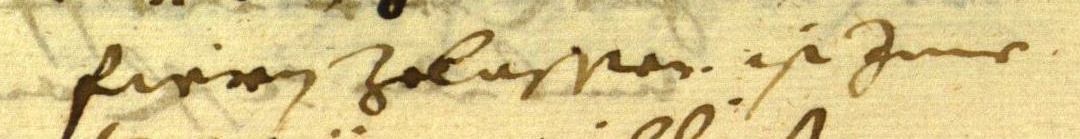fiern Zelassen. ist Ime
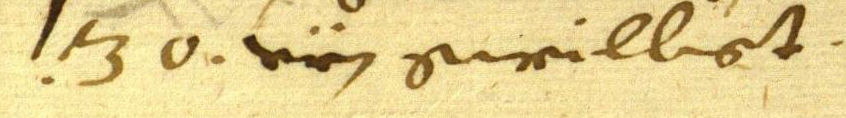.30. v̈rn gewilligt.
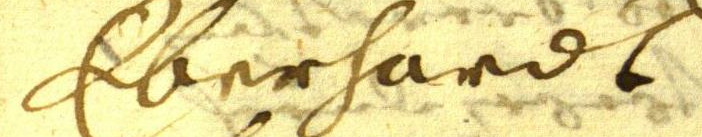Eberhardt
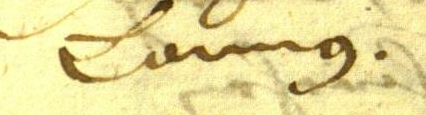Lanng.
